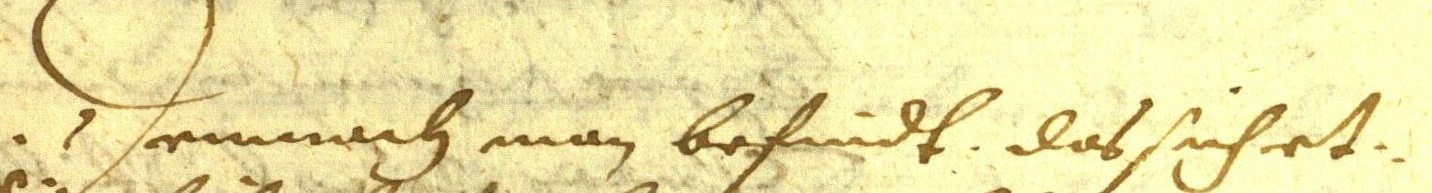Demnach man befindt. das sich et¬
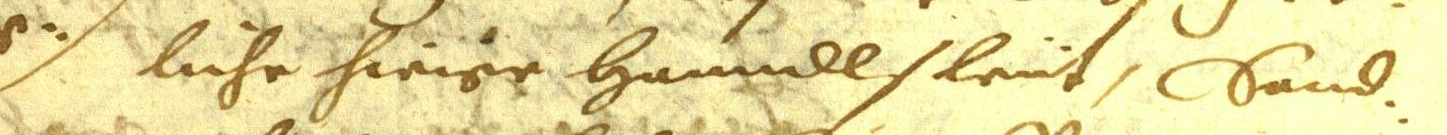liche hieige Hanndlsleüt, Sond-
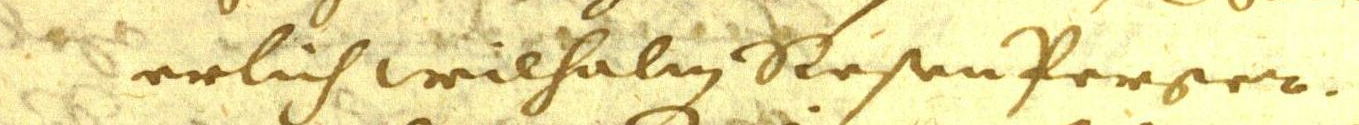erlich wilhalm Resen Perger.
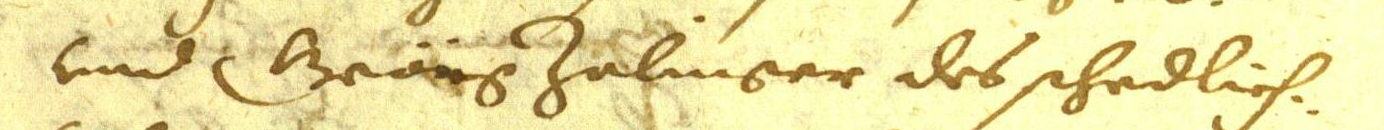vnd Geörg Zalinger des schedlich¬
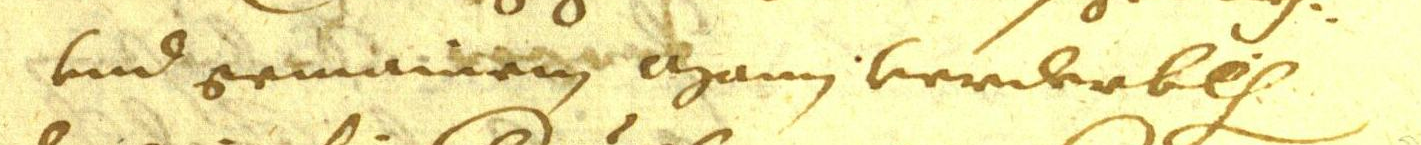vnd gemainen Mann verderbl
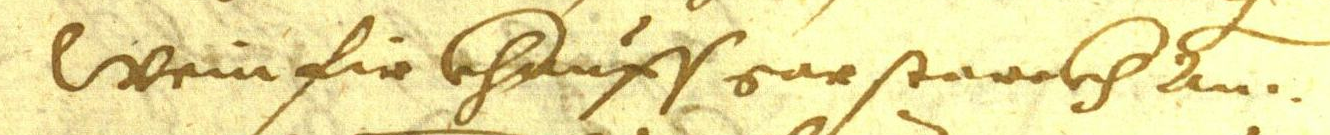Wein fir khaūff gar starckh An¬
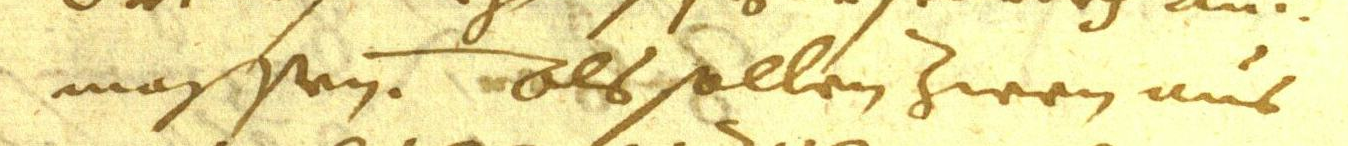massen. Als sollen Zwen aūs
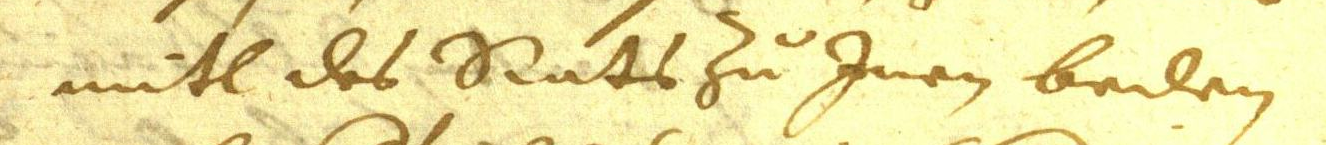mitl des Rats Zū Inen beden
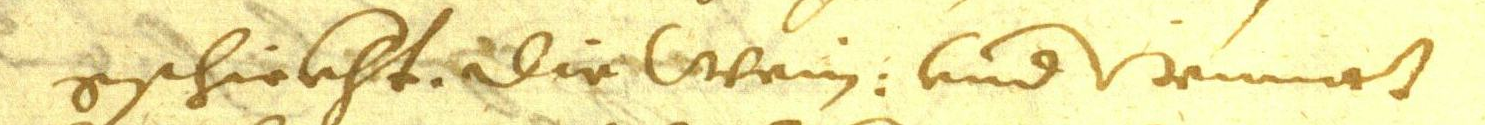gschickht. die Wein: vnd Wimat
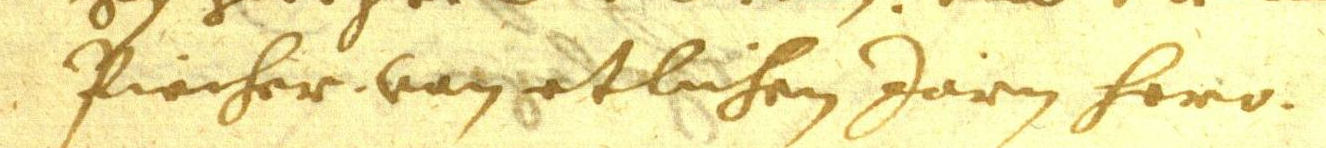Piecher. von etlichen Jarn hero¬
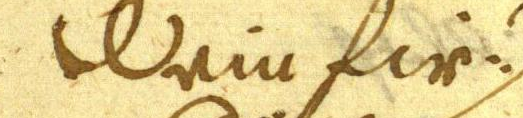Wein fir¬
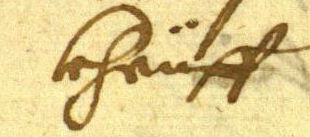kheüff
